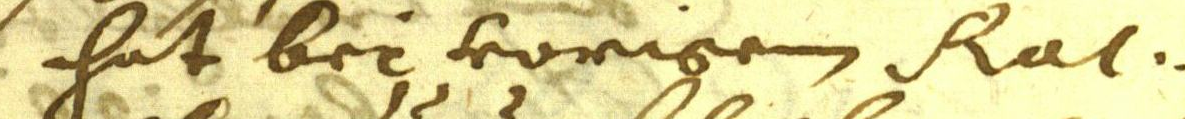Hat bei vorigem Rat¬
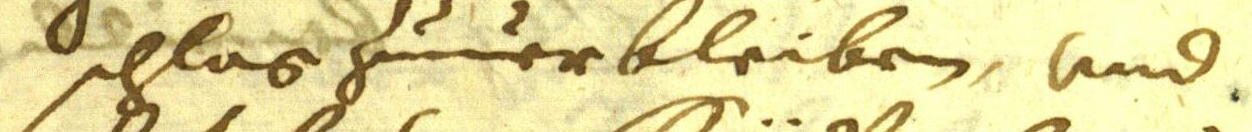schlag Zūūerbleiben, vnd
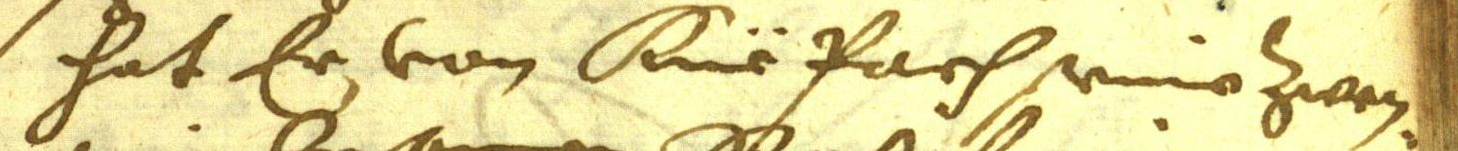hat Er von Küe Pach seine Zwen
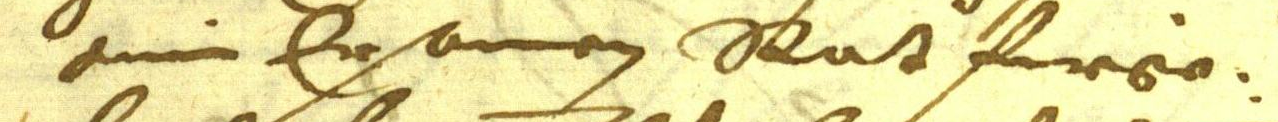aim Ersamen Rat firge¬
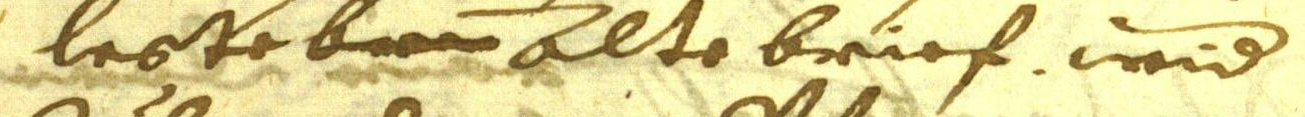legte bri Alte brief. wid
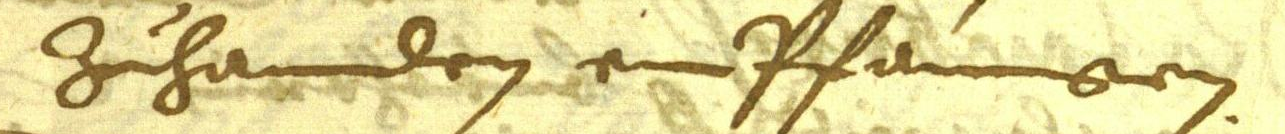Zūhannden emPfanngen.
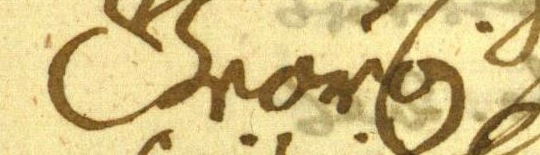Geōrg
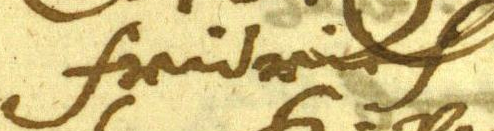Fridrich
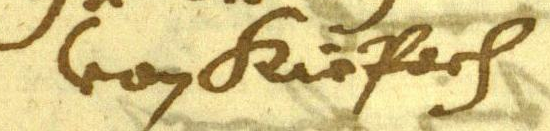von KiePach
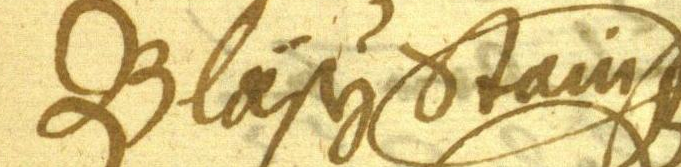Bläsȳ Stain¬
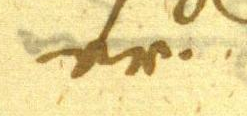er.
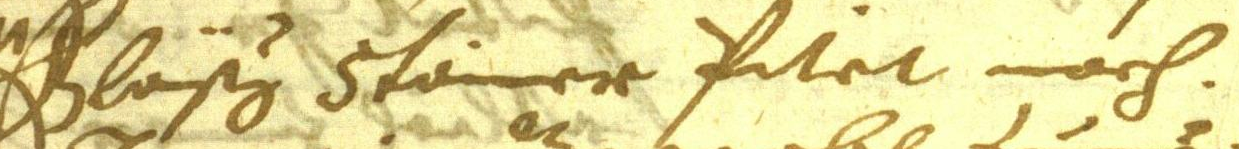Bläsȳ Stainer Pitet noch.
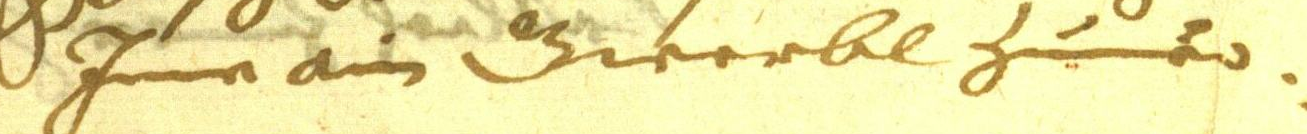Ime ain Gwerbl Zūūer¬
